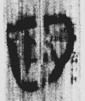四
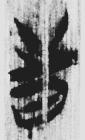旹（時）
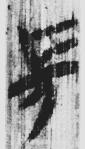長
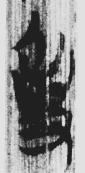事
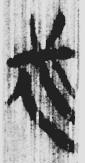必
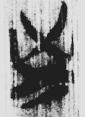至
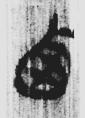西
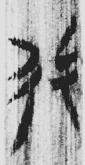行
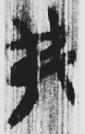弗
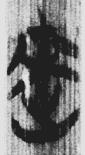○（來）
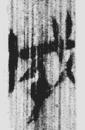成
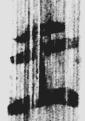王
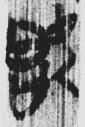既
